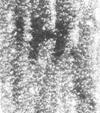三十
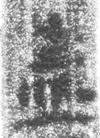簦
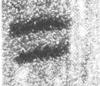二
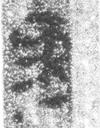聅
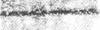一
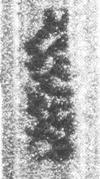膚（鑪）
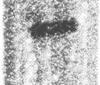一
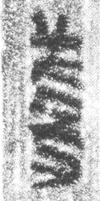膚
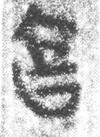合（盒）
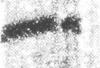一
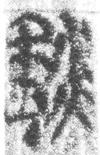錟（挑）
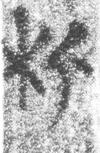朼（匕）
